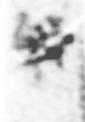牧
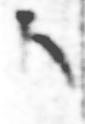人
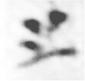之
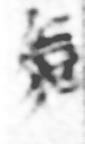騏
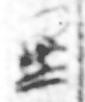爲
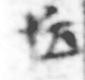○（左）
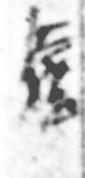○（服）
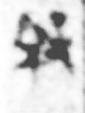牧
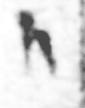人
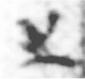之
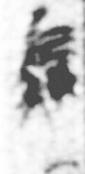駟
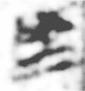○（右）
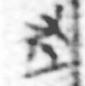○（服）
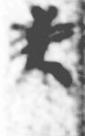朱
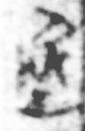○（路）
